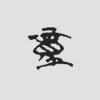童
